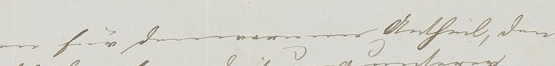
Ihnen für den warmen Antheil, den
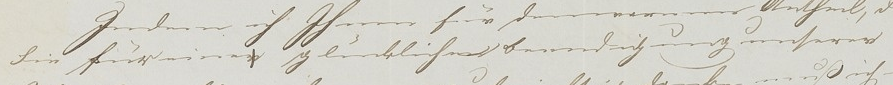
Sie für einen glückliche Beendigung unserer
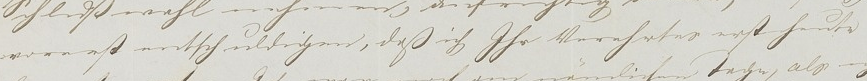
vorerst entschuldigen, daß ich Ihr Verehrtes erst heute
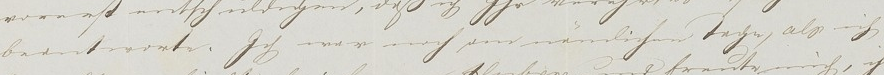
beantworte. Ich war noch am nämlichen Tage, als ich
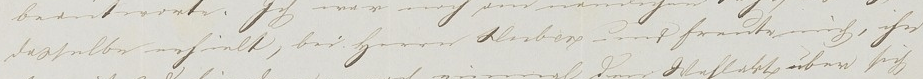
dasselbe erhielt, bei Herrn Huber und freute mich, ihn
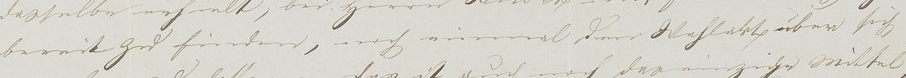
bereit zu finden, noch einmal den Wahlakt über sich
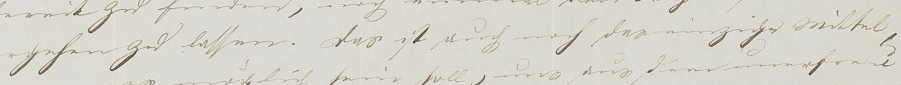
ergehen zu lassen. Das ist auch noch das einzige Mittel,
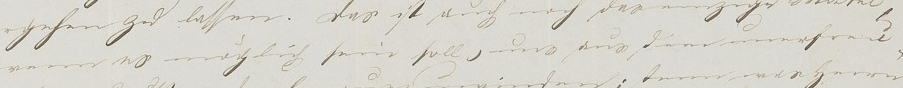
wenn es möglich sein soll, uns aus dem unerfreu-
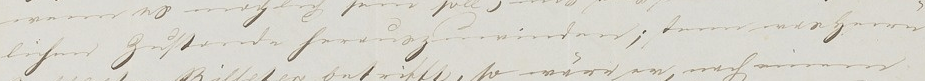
lichen Zustande herauszuwinden; denn was Herrn
